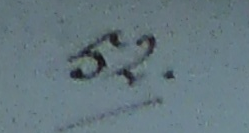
52.
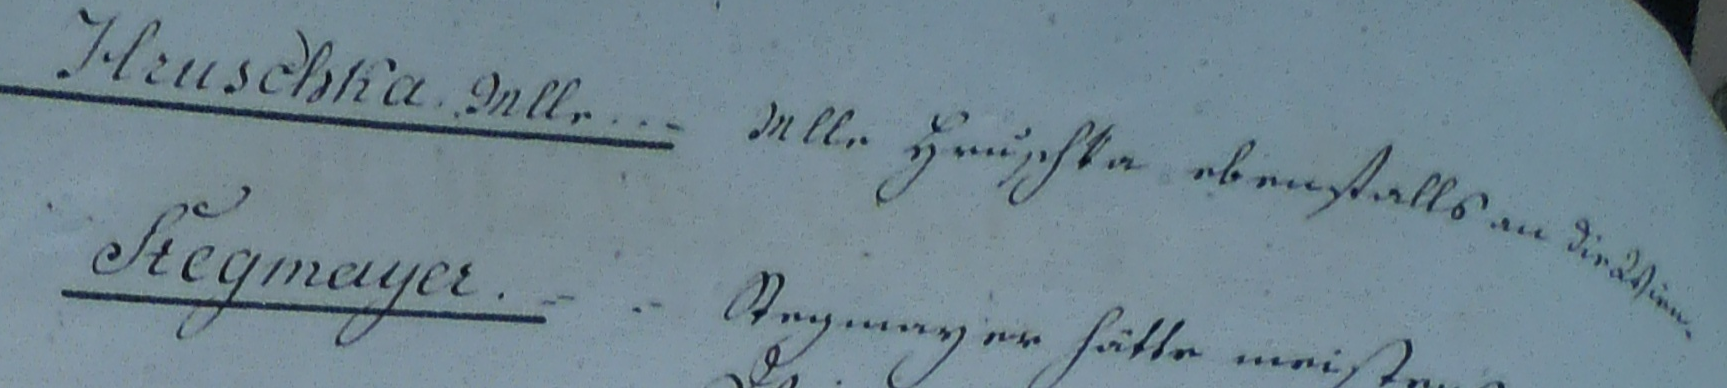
Hruschka Mlle . . . Mlle Hruschka ebenfalls an die Wien.
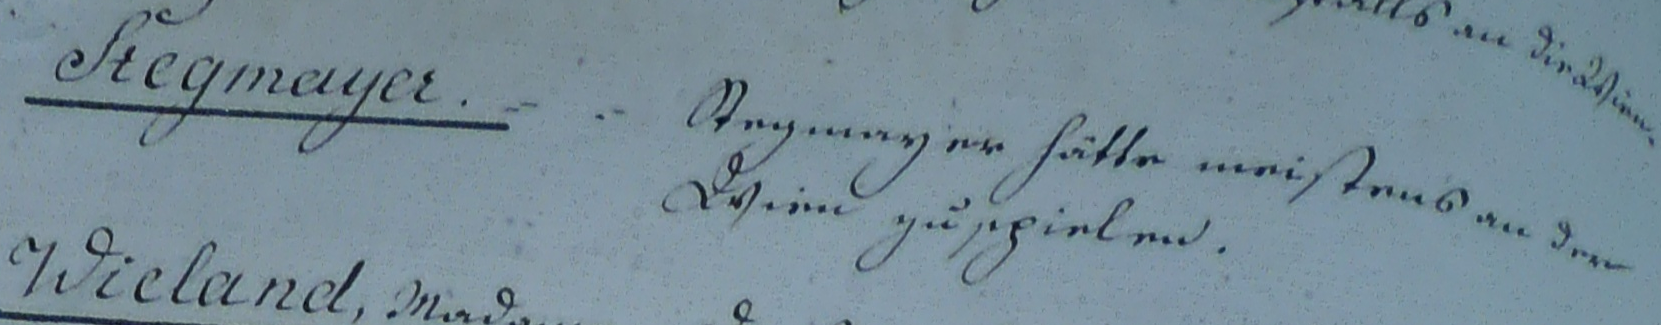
Stegmayer. : : Stegmayer hätte meistens an der
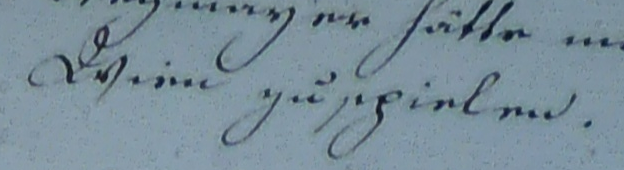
Wien zuspielen.
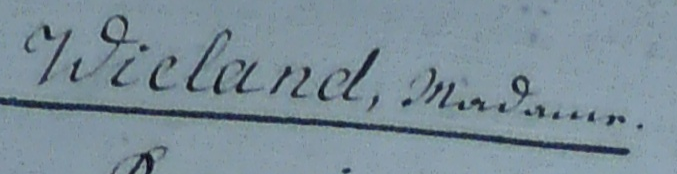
Wieland, Madame.
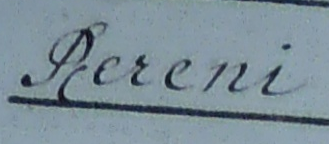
Rereni
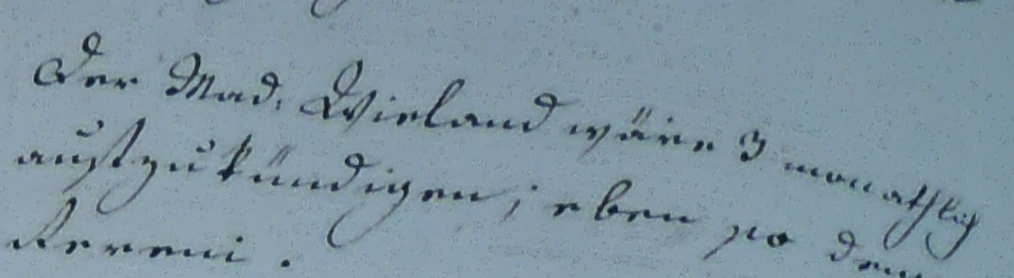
Der Mad: Wieland wäre 3 monathlich
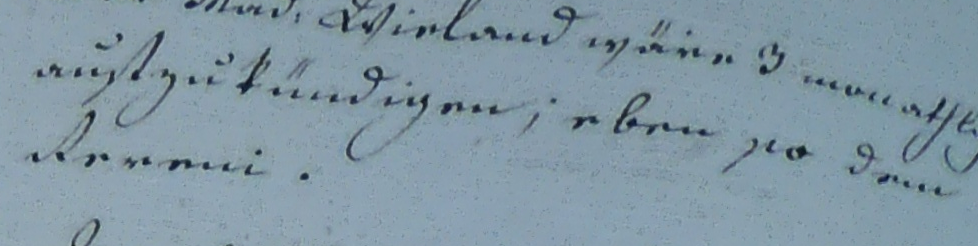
aufzukündigen, eben so dem
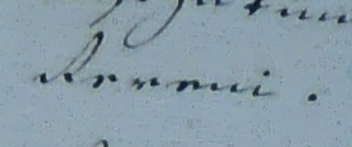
Rereni.
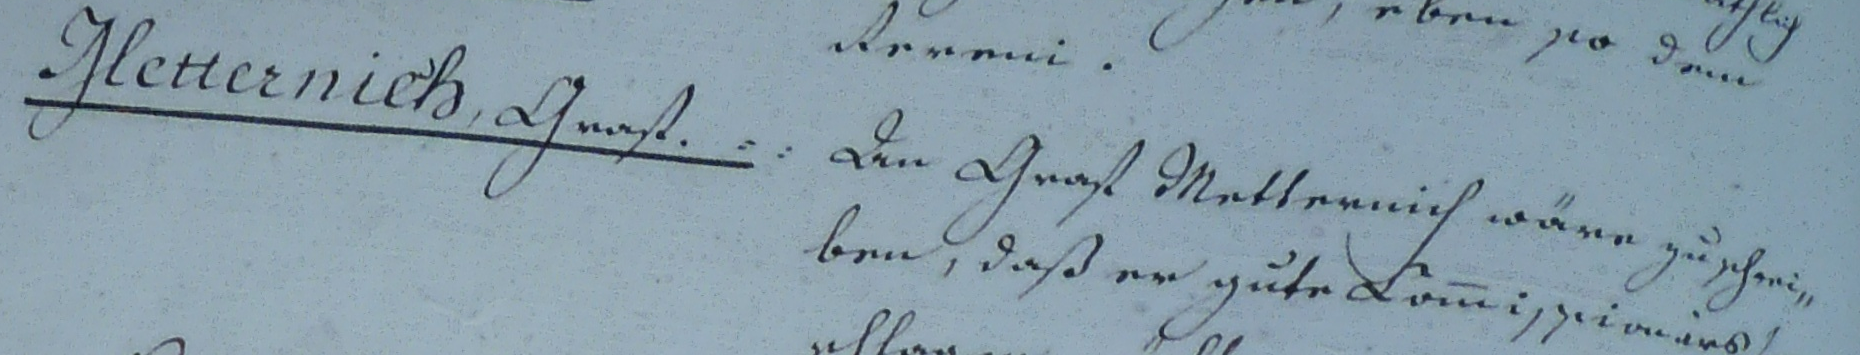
Metternich, Graf. : : An Graf Metternich wäre zu schrei¬
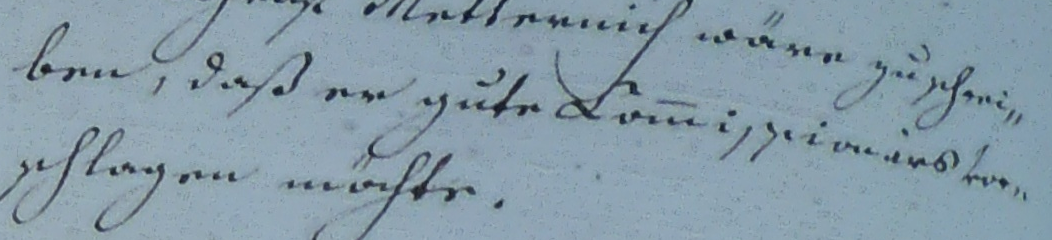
ben, daß er gute Comissionärs vor¬
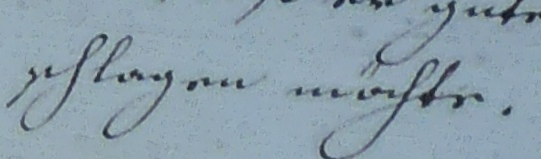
schlagen möchte.
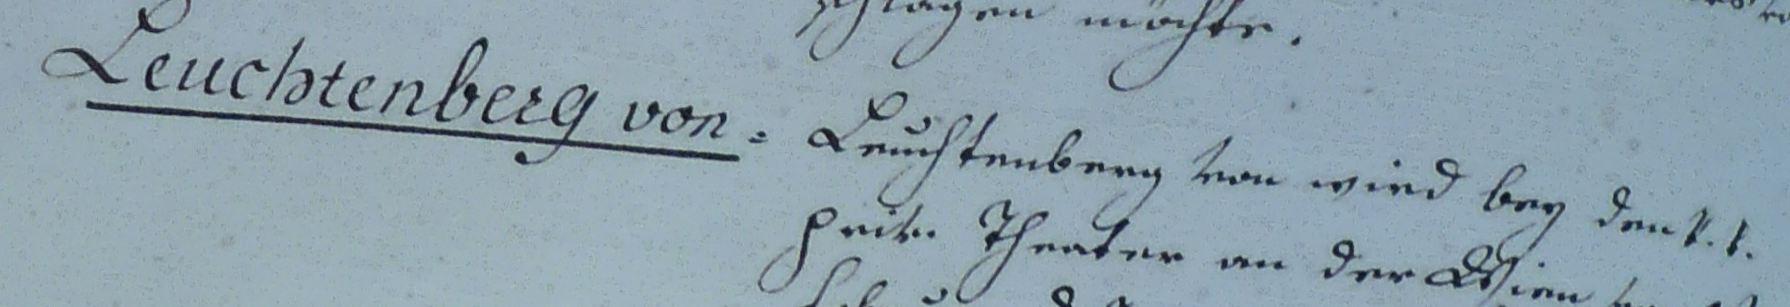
Leuchtenberg von : Leuchtenberg von wird bey den k.k.
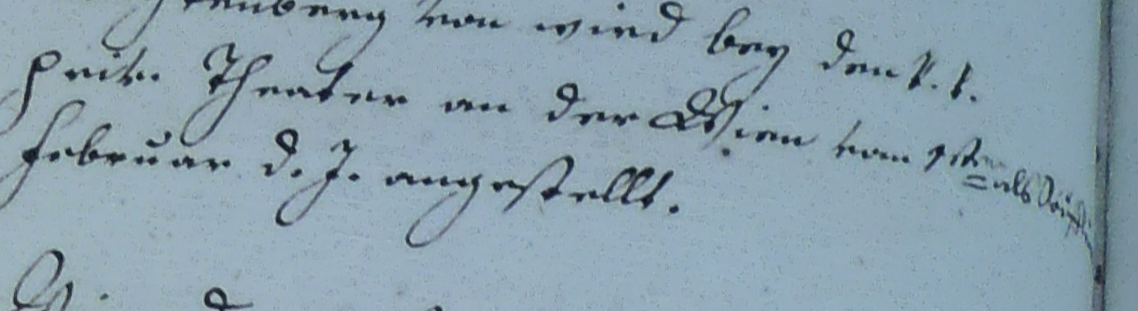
priv. Theater an der Wien vom 1ste͇n als Souffleur
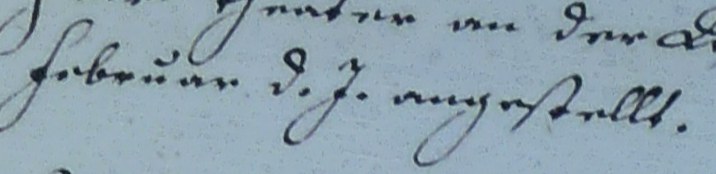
Februar d. J. angestellt.
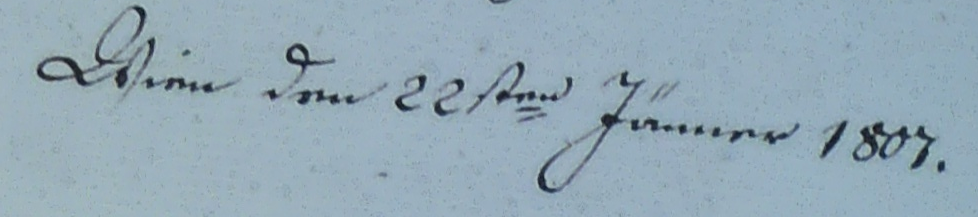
Wien den 22ste͇n Jänner 1807.
